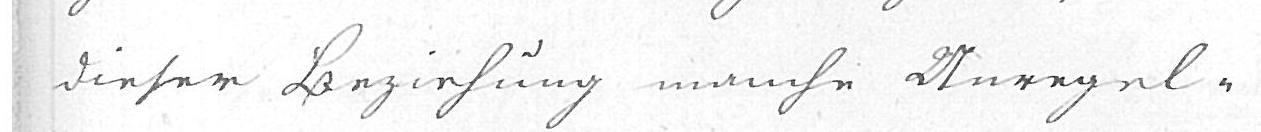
dieser Beziehung manche Unregel-
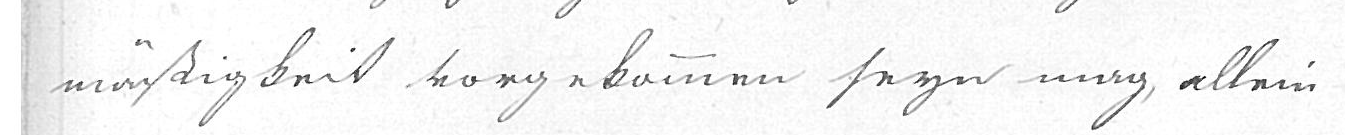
mäßigkeit vorgekommen seyn mag, allein
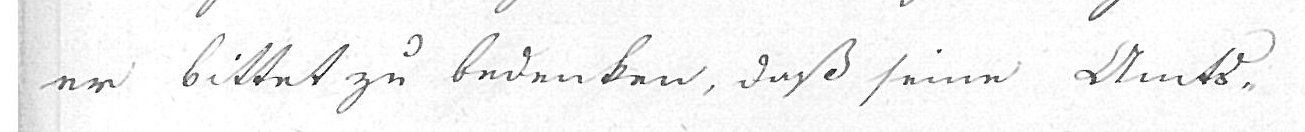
er bittet zu bedenken, daß seine Amts-
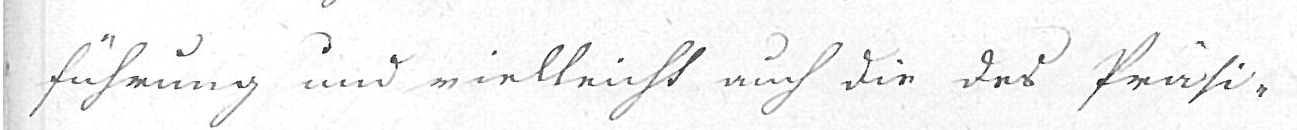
führung und vielleicht auch die des Präsi-
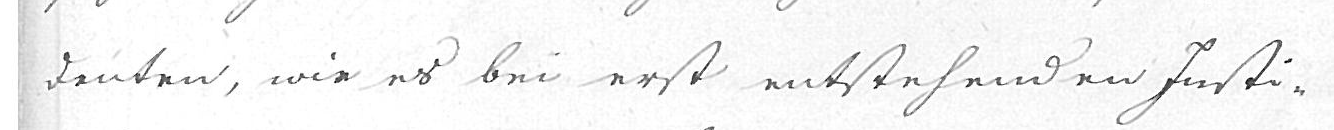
denten, wie es bei erst entstehenden Justi-
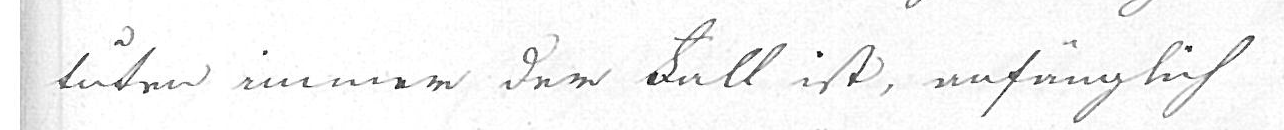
täten immer der Fall ist, anfänglich
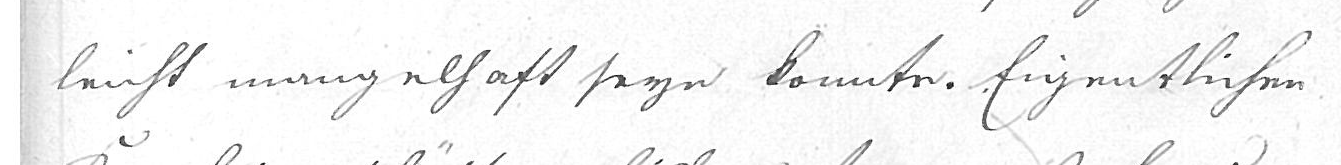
leicht mangelhaft sey konnte. Eigentlichen
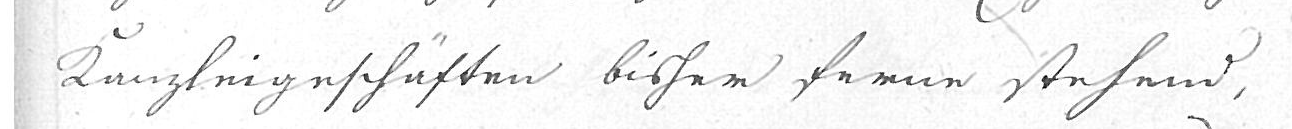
Kanzleigeschäften bisher ferne stehend,
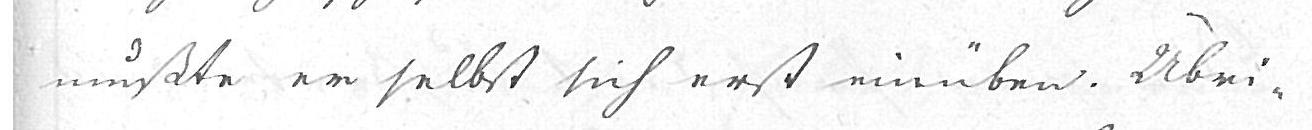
mußte er selbst sich erst einüben. Übri-
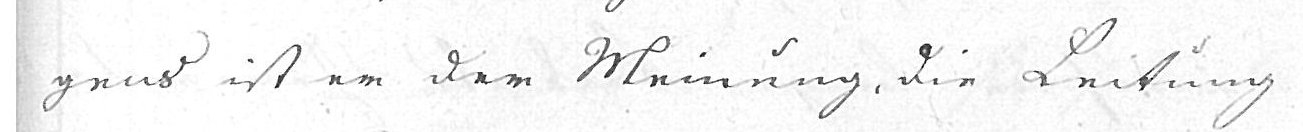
gens ist er der Meinung, die Leitung
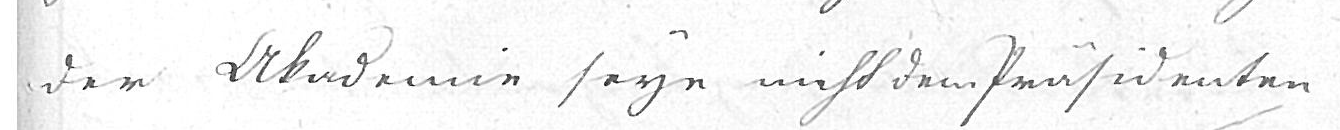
der Akademie sey nicht dem Präsidenten
